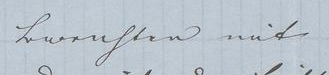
Berichten mit
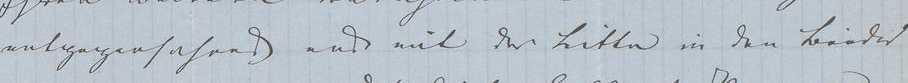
entgegensehend und mit der Bitte in den Bundes-
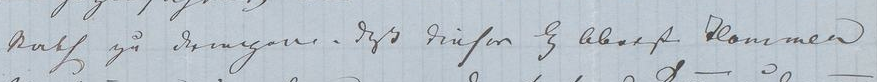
Rath zu dringen – daß dieser Herrn Oberst Hammer
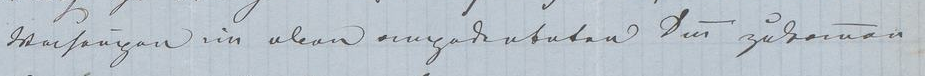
Weisungen im oben angedeuteten Sinn zukommen
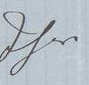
Ihr
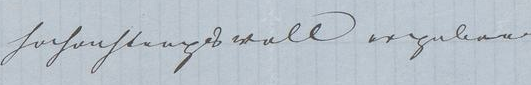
hochachtungsvoll ergebener
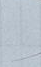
Dr
